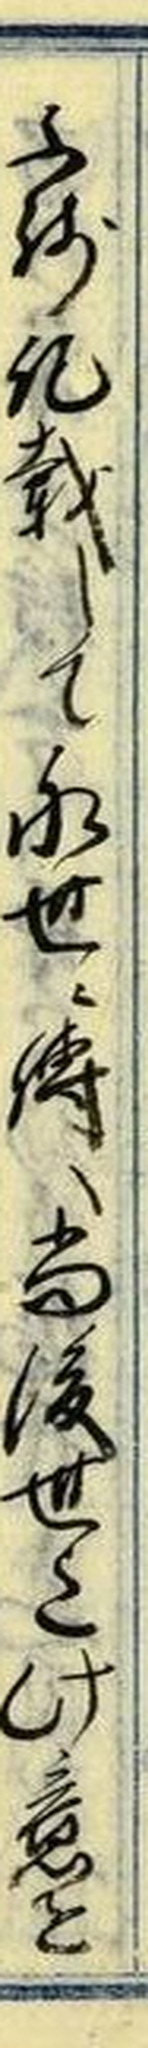不残記載して永世ニ伝へ尚後世迄此意を
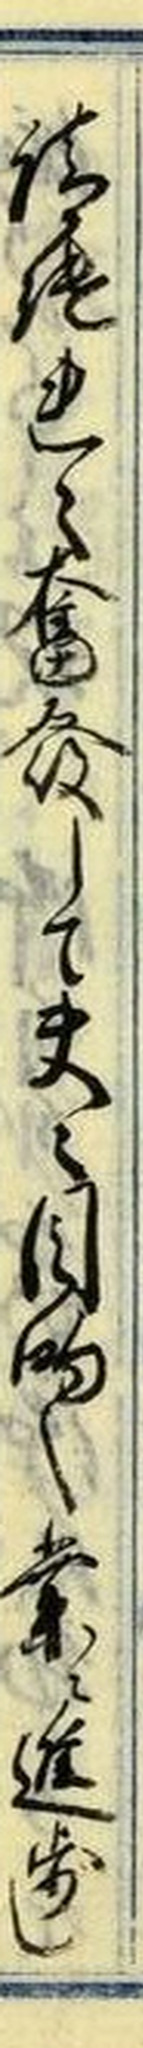請継連々奮発して夫々目的之業ニ進歩し
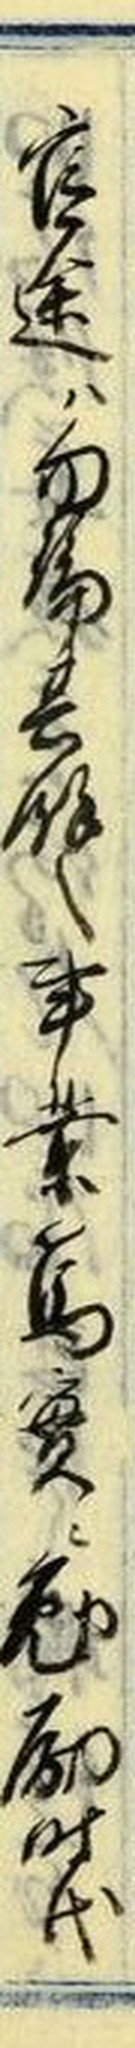官途ハ勿論其余之事業篤実ニ勉励時代
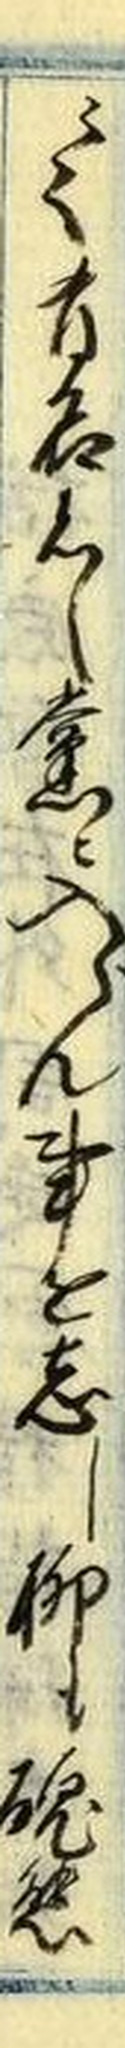々々有名者之党ニ入らん事を志し聊も醜態
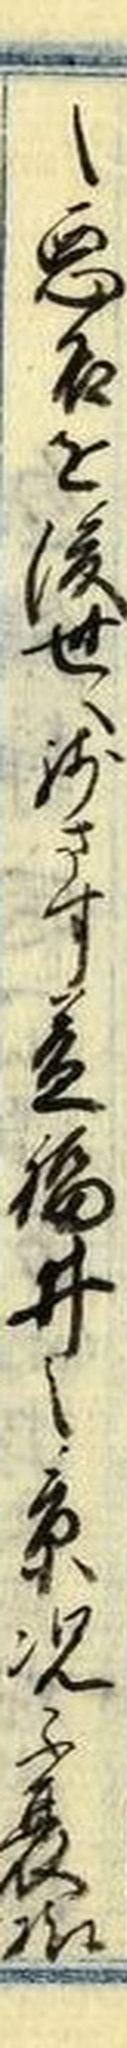之悪名を後世へ残さす蓋福井之景況不衰様
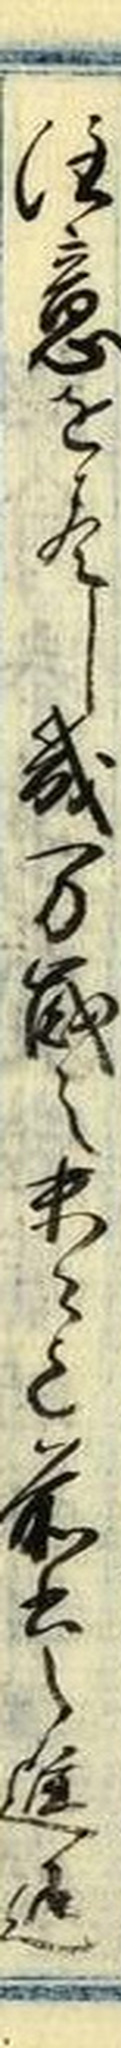注意を尽し幾萬歳之未々迄前書之進退
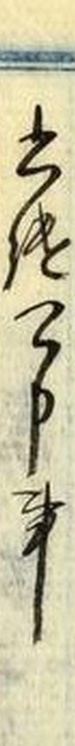書継可申事
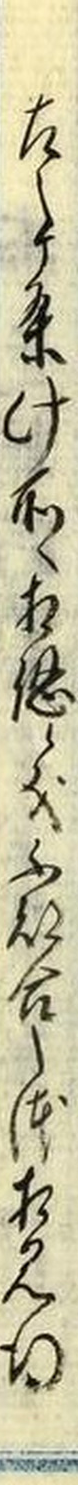右之ケ条此所へ相認候義不都合之体相見得
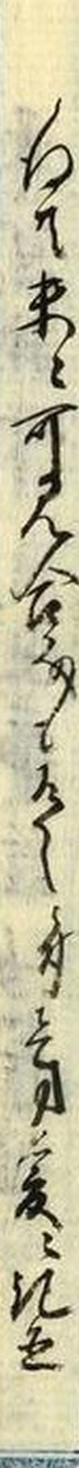候得共未々可見合義も有之候ニ付旁爰ニ記置
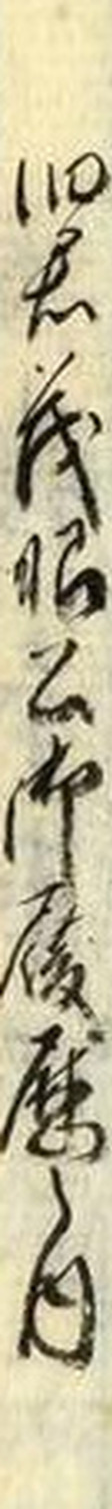旧君茂昭公御履歴之内
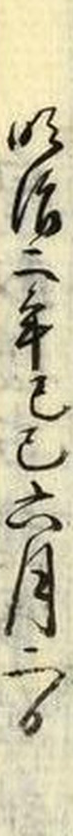明治二年己巳六月二日

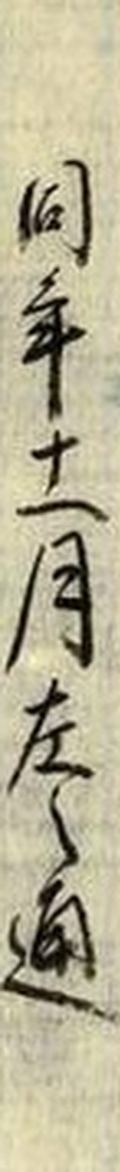同年十一月左之通
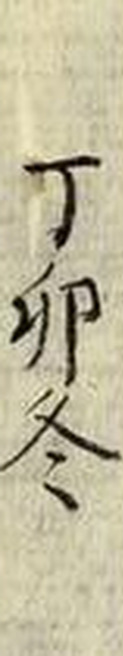丁卯冬
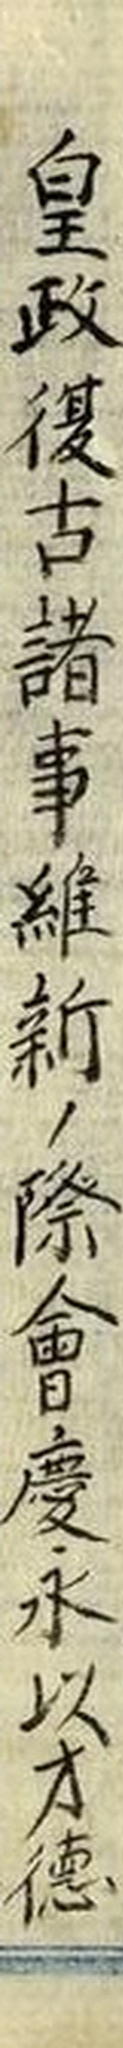皇政復古諸事維新ノ際会慶永以才徳
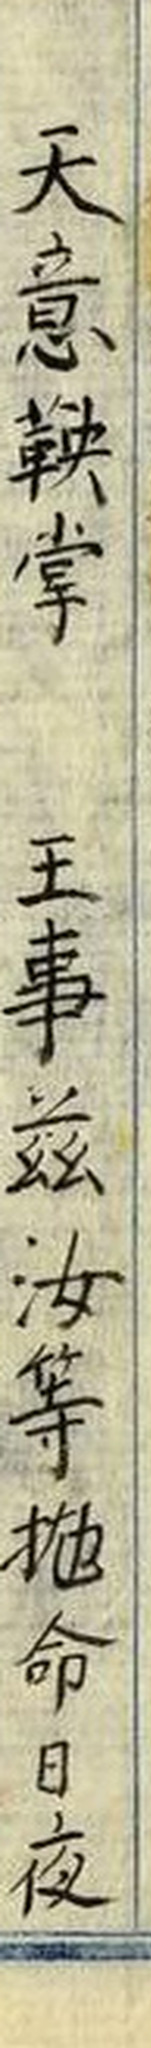天意鞅掌王事茲汝等抛命日夜
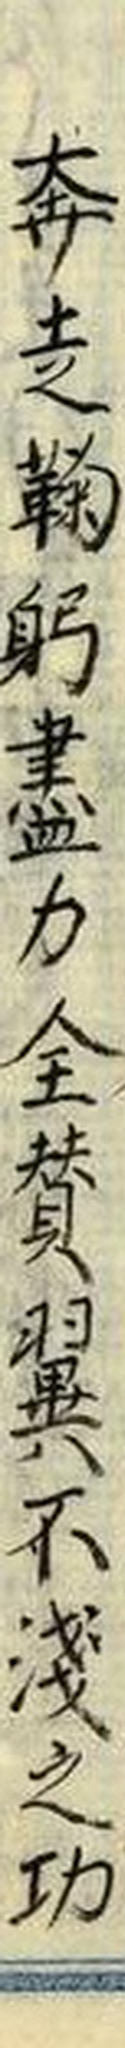奔走鞠躬盡力全賛翼不浅之功
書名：温古集 三巻
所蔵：福井県文書館 Fukui Prefectural Archives
